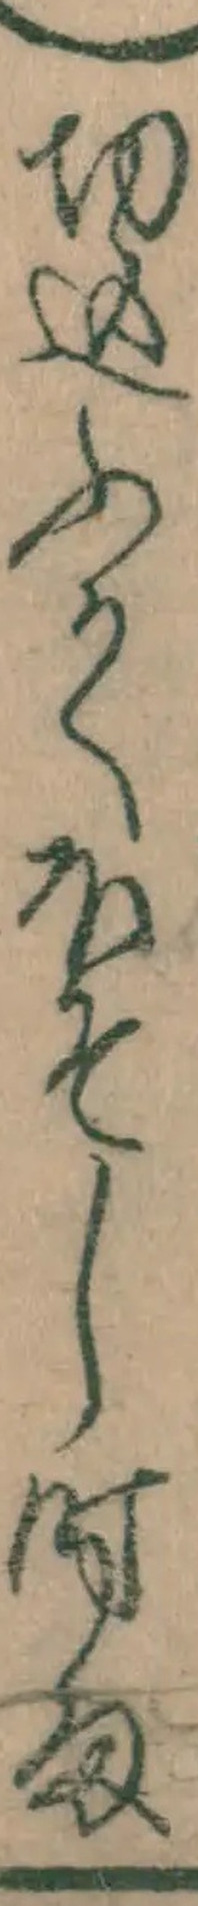錦切込ふかくほそし時雨
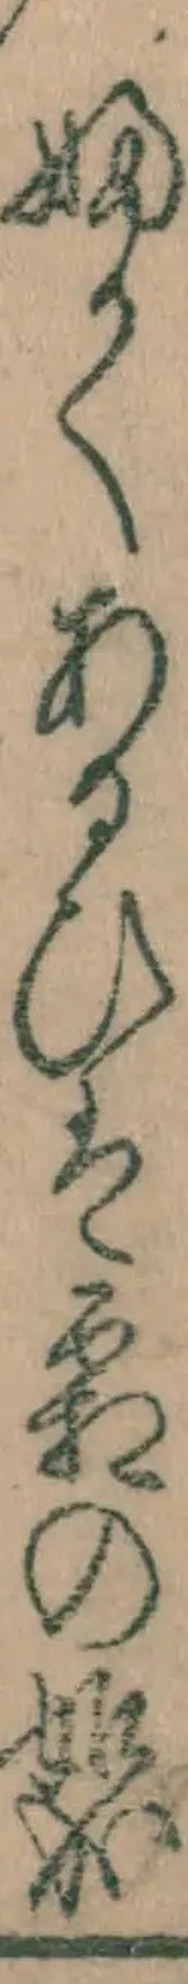ふかくあるひは霜の如成
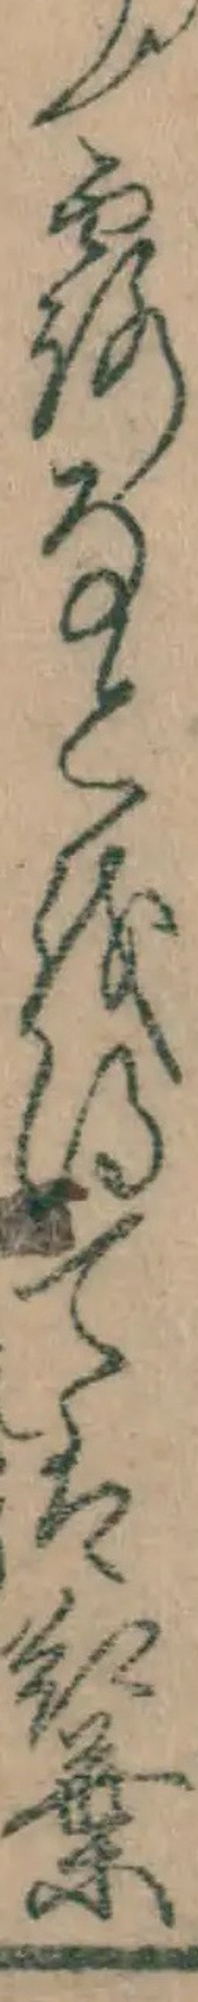露などを得ては紅葉
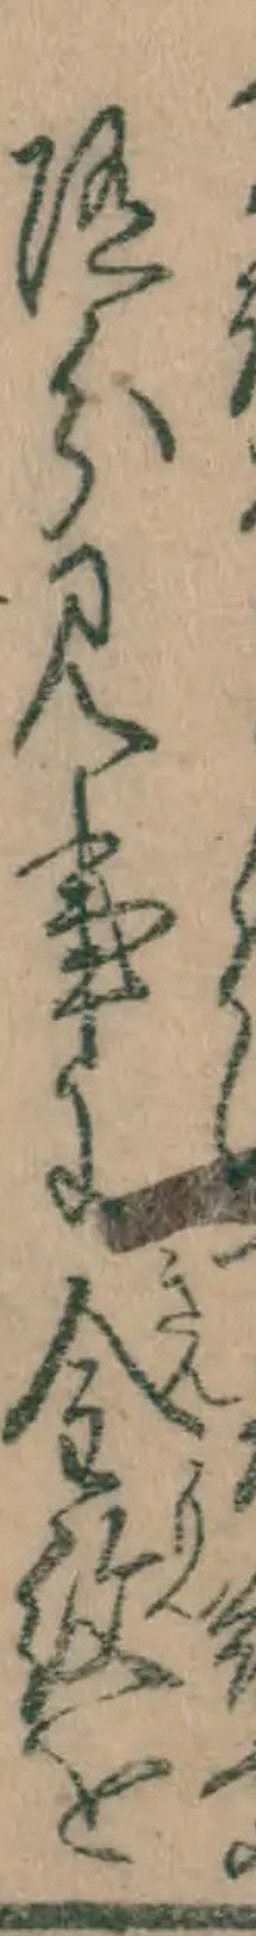随分見事に金紋を
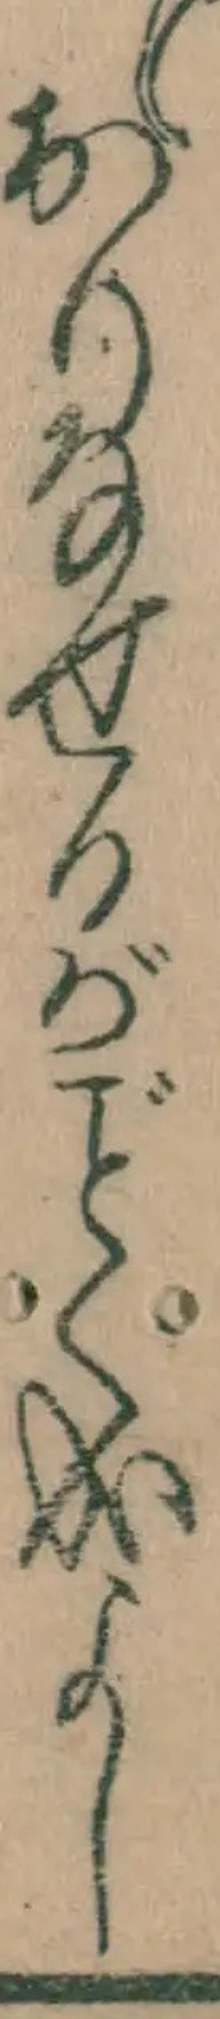おりなせるがごとく成よし
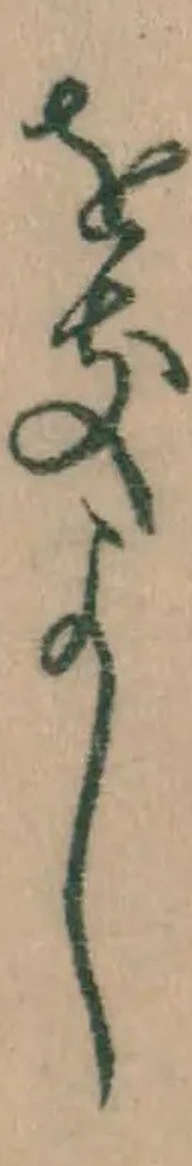をきよし
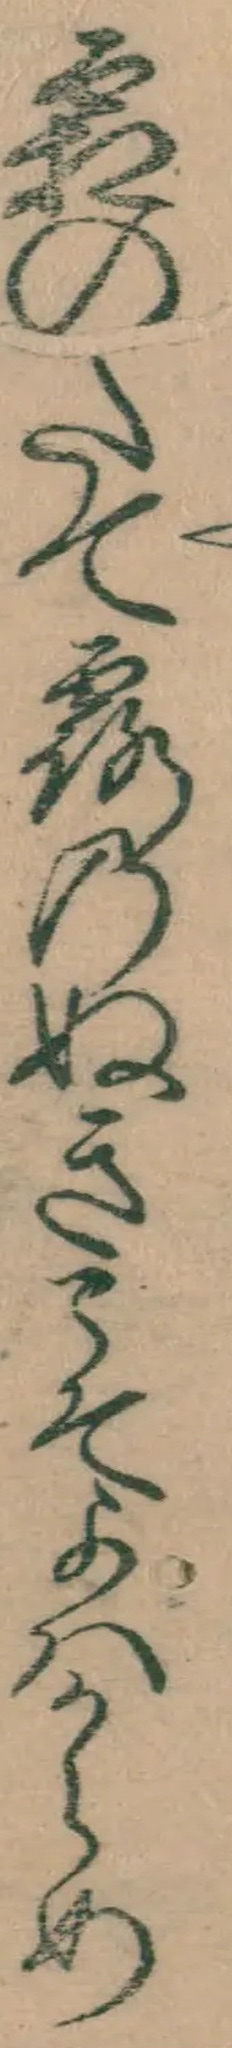霜のたて露のぬきこそよはからめ
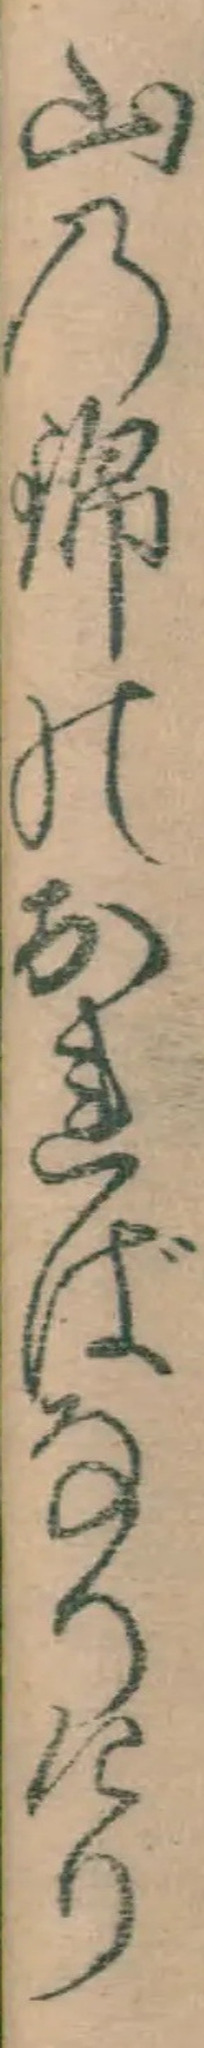山の錦のおればなりけり
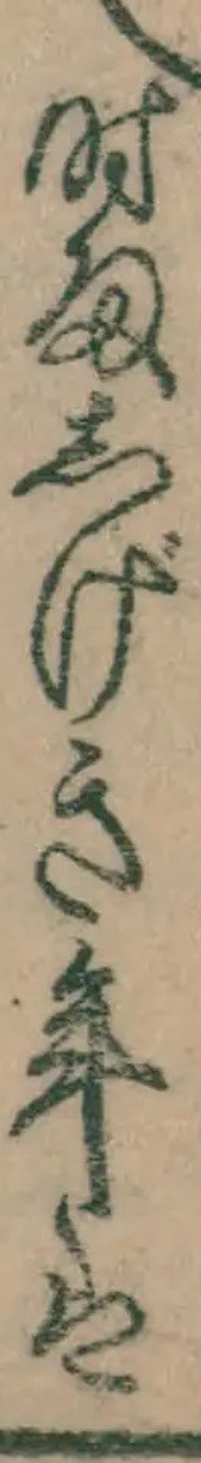時雨しげき年は
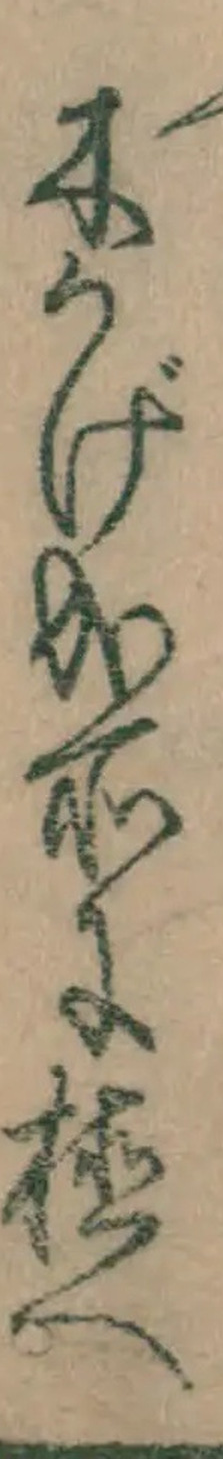立木かげ成所に植へ

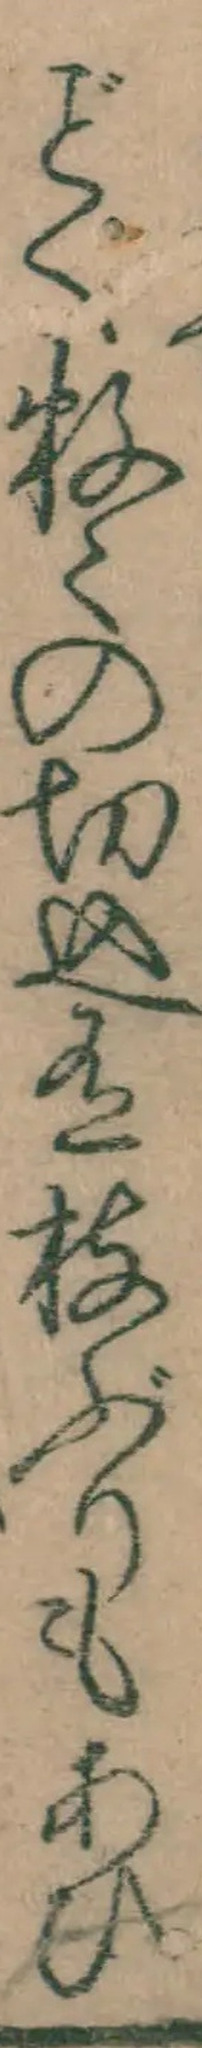ごとく数々の切込有枝ぶりもあひ
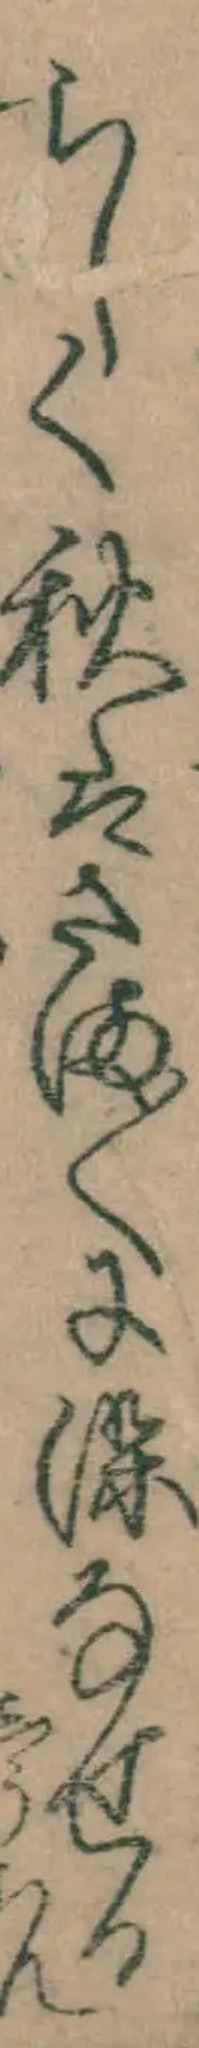らしく秋はさま〳〵に染なせる
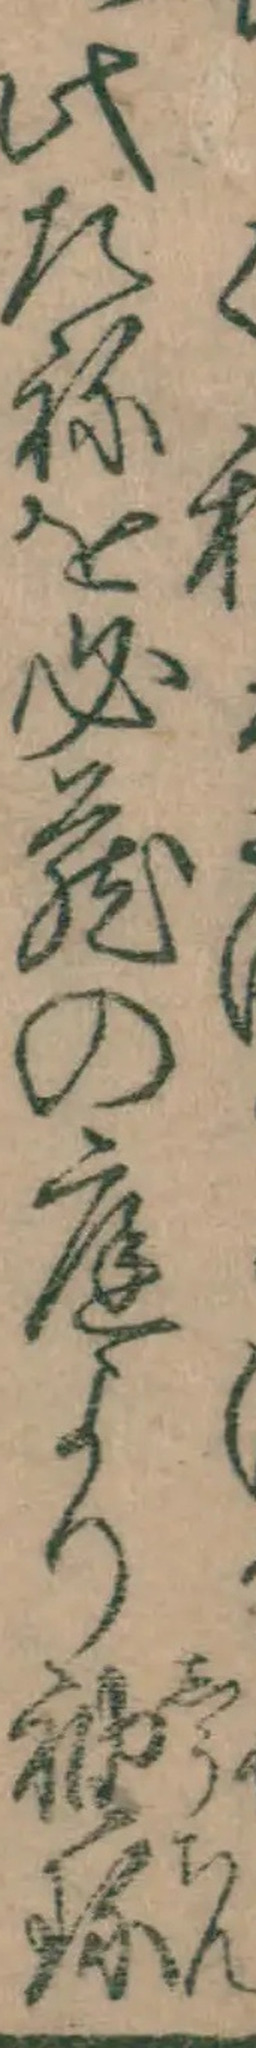此たねを必蔵の庭より袖珍
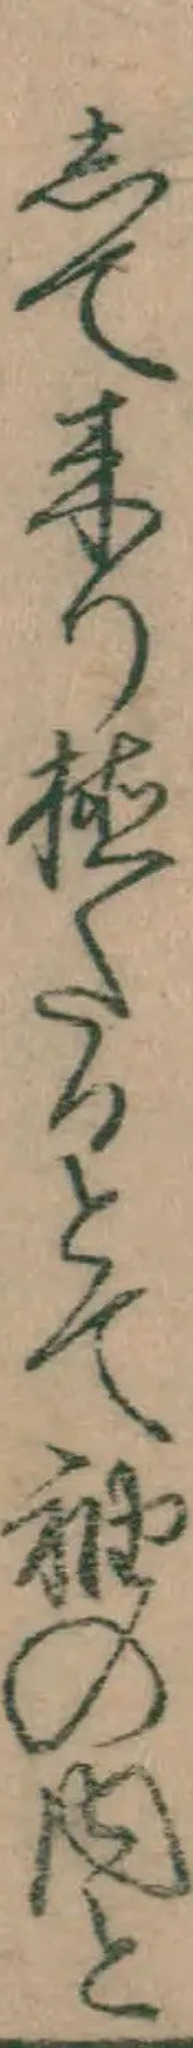して来り植たるとて袖の内と
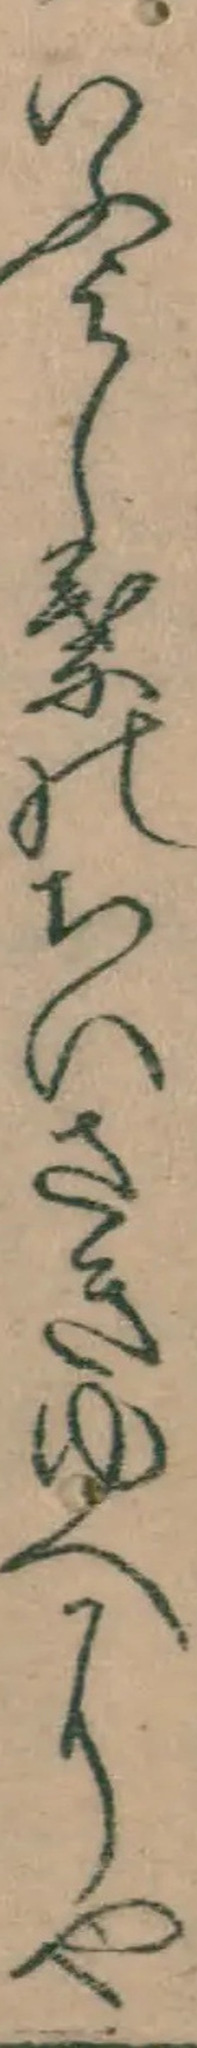いふよし葉のちいさきゆへにや
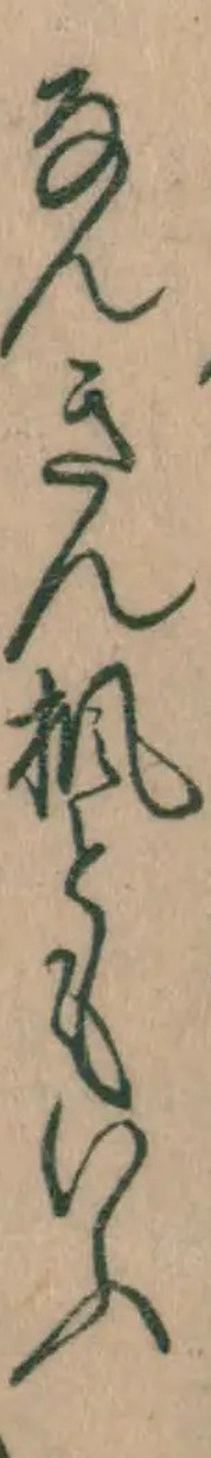なんきん楓ともいふ
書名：紅葉集
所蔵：国立国会図書館 National Diet Library, JAPAN
